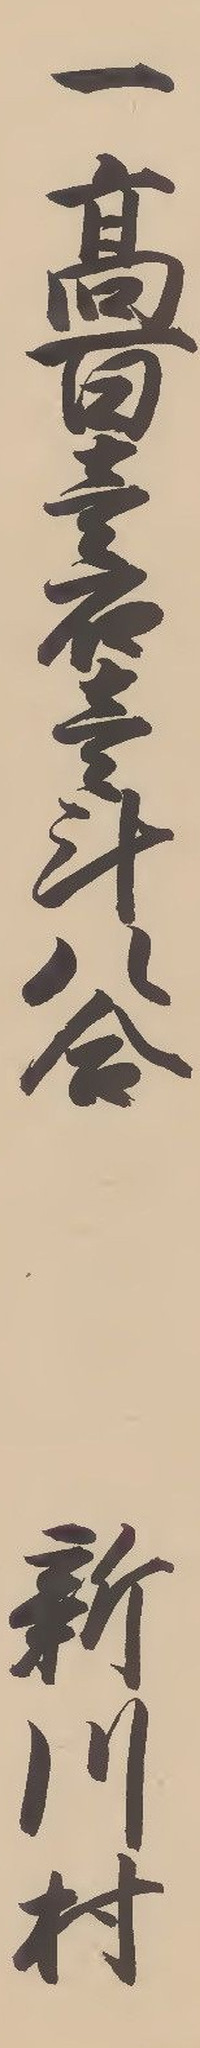一高百壱石壱斗八合新川村
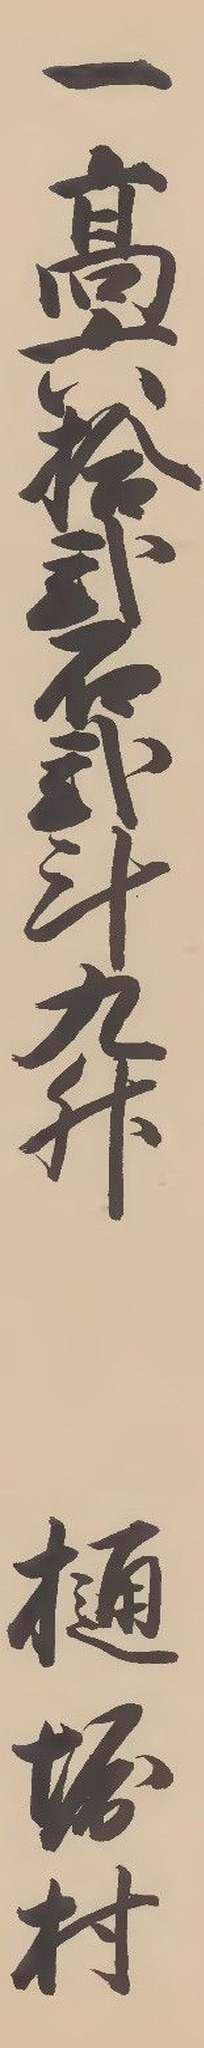一高六拾弐石弐斗九升樋堀村
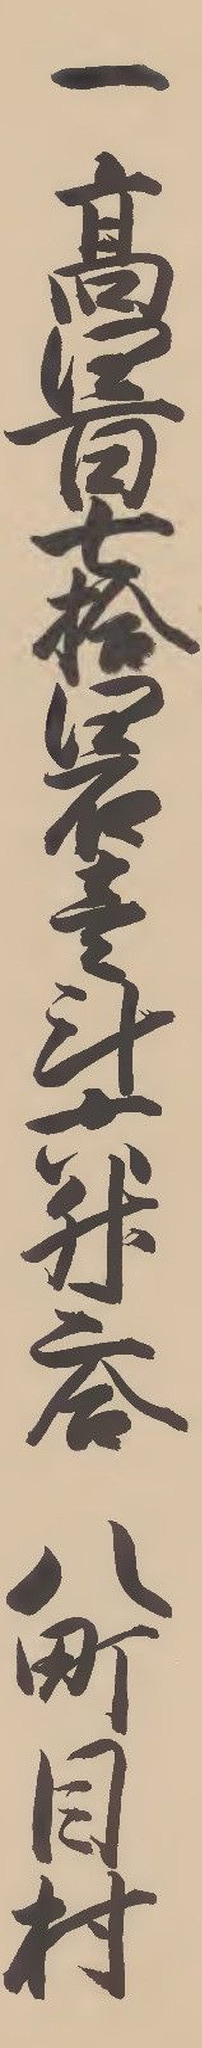一高四百七拾四石壱斗六升三合八町目村
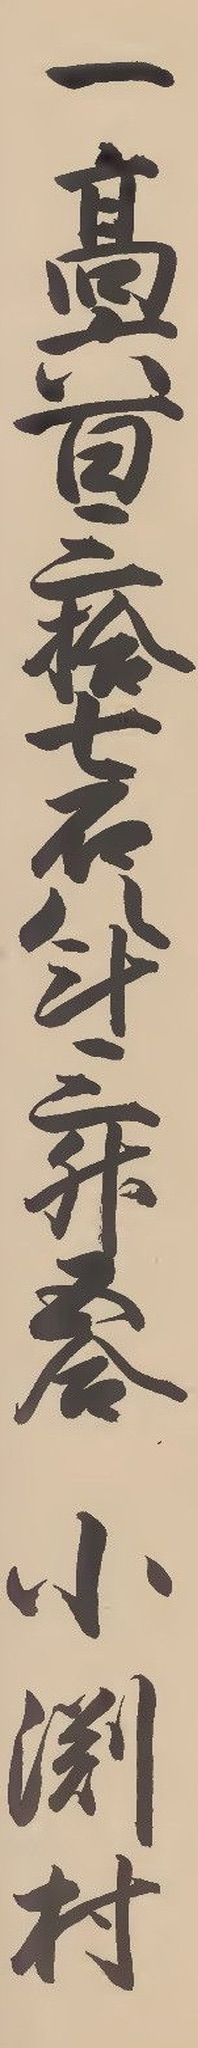一高六百三拾七石八斗三升五合小渕村
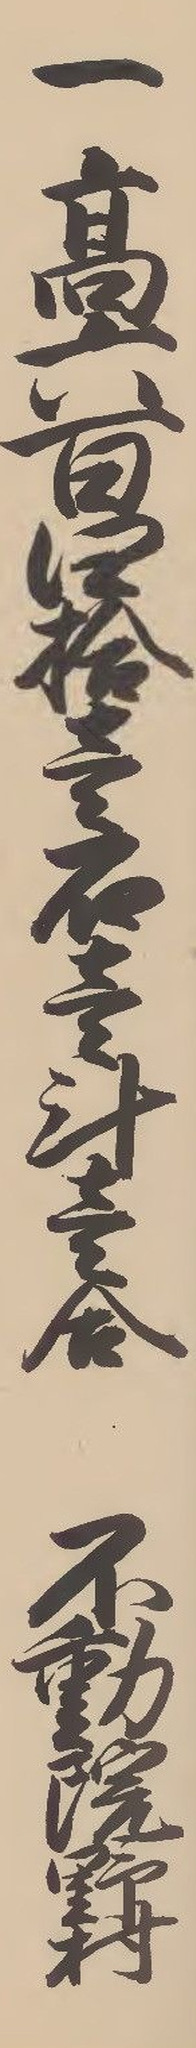一高六百四拾壱石壱斗壱合不動院野村
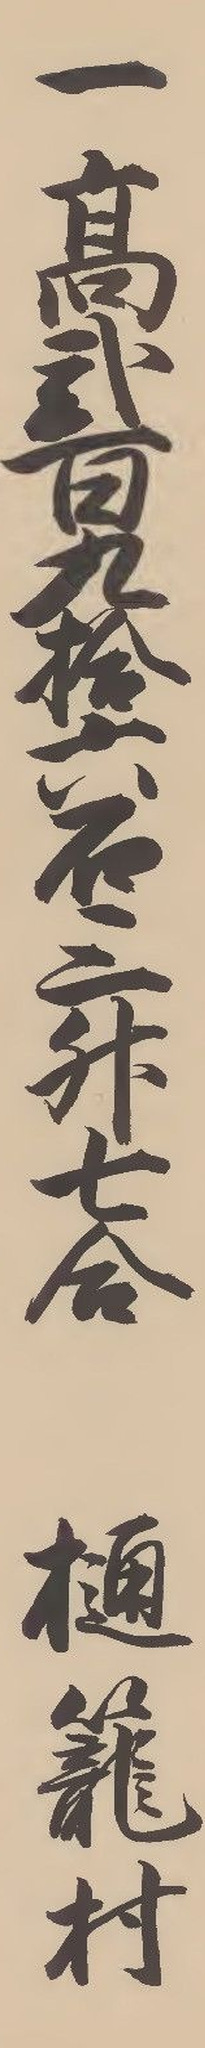一高弐百九拾六石三升七合樋籠村
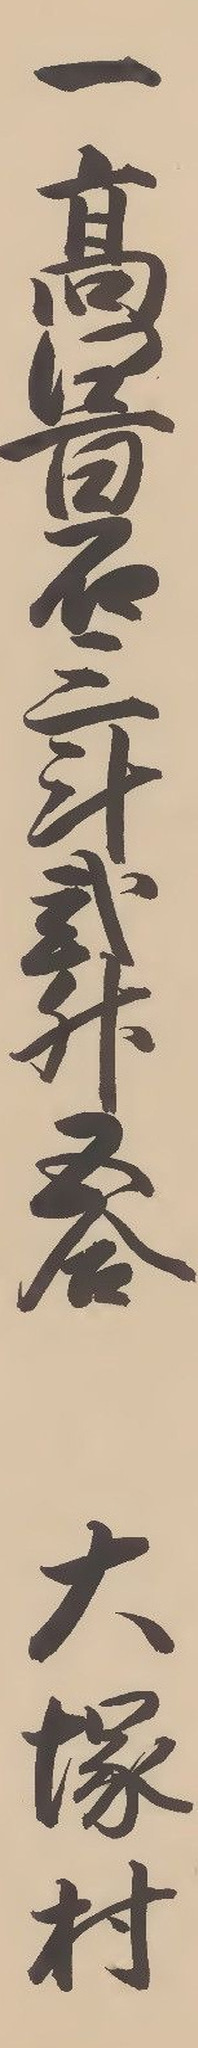一高四百石三斗弐升五合大塚村
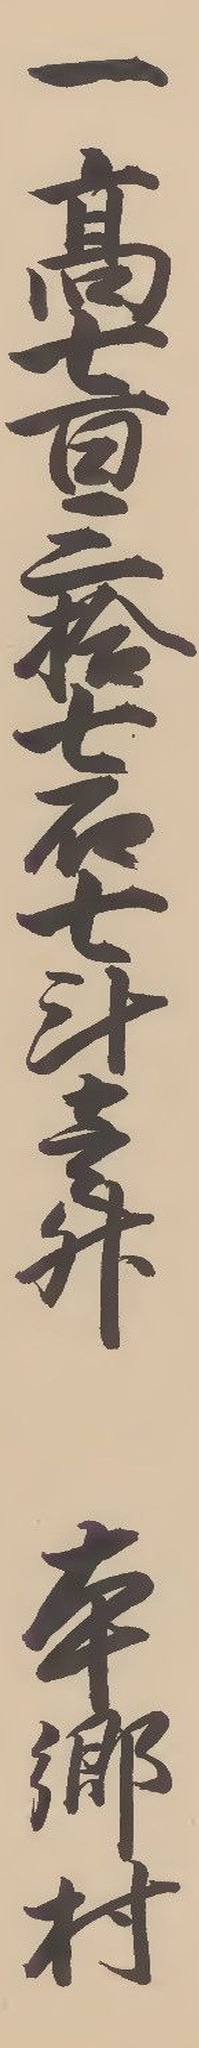一高七百三拾七石七斗壱升本郷村

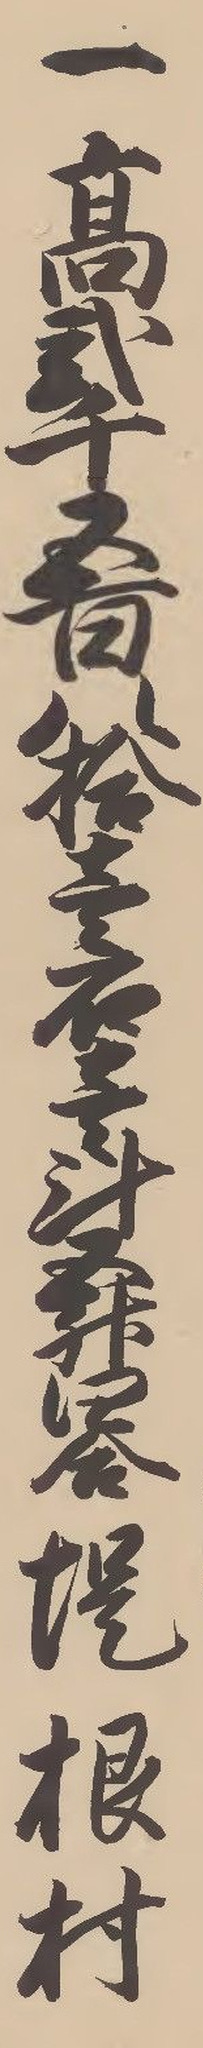一高弐千五百八拾壱石壱斗五升四合堤根村
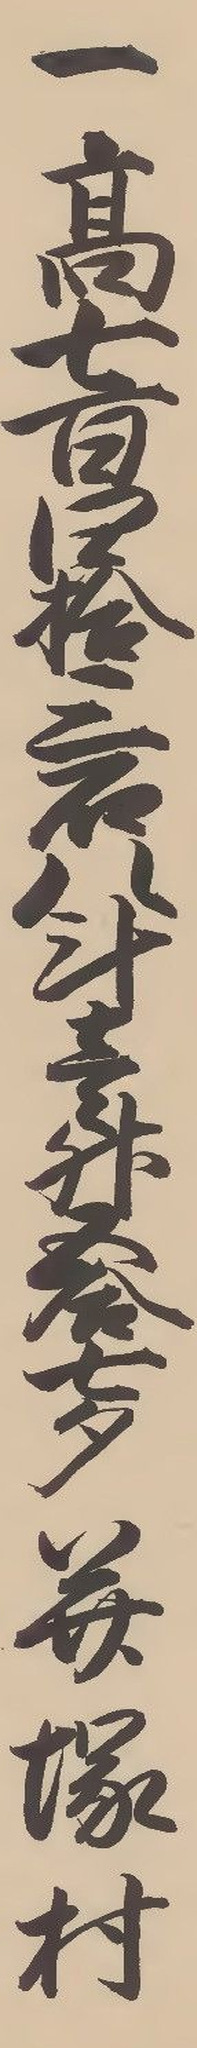一高七百四拾三石八斗壱升五合七勺笹塚村
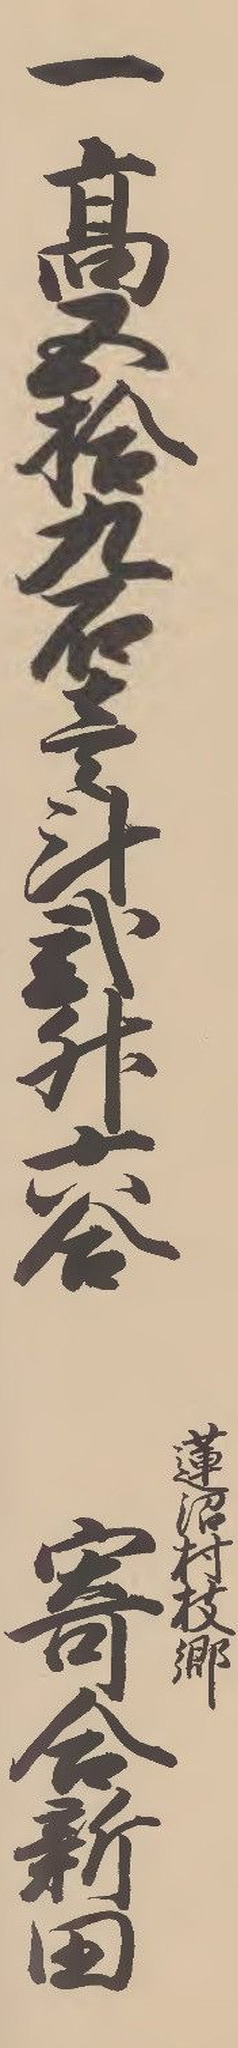一高五拾九石壱斗弐升六合寄合新田
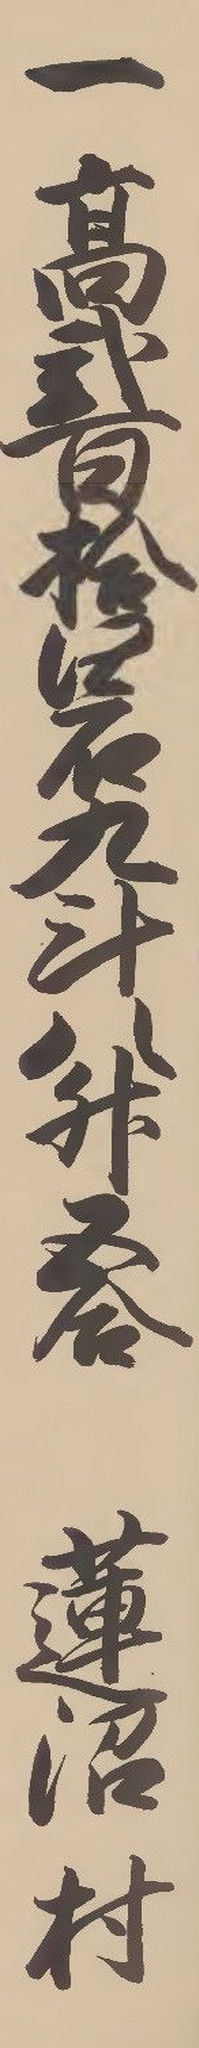一高弐百拾四石九斗八升五合蓮沼村
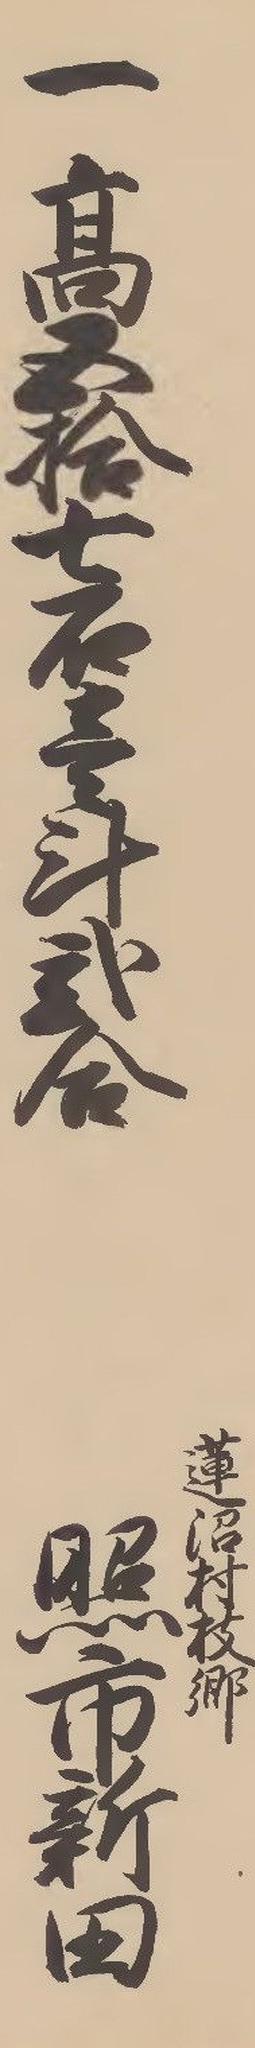一高五拾七石壱斗弐合照市新田
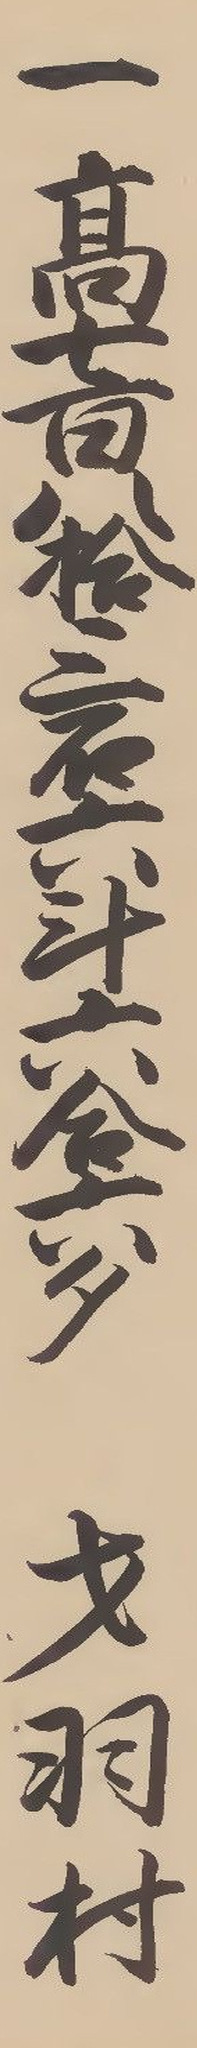一高七百八拾三石六斗六合六勺才羽村
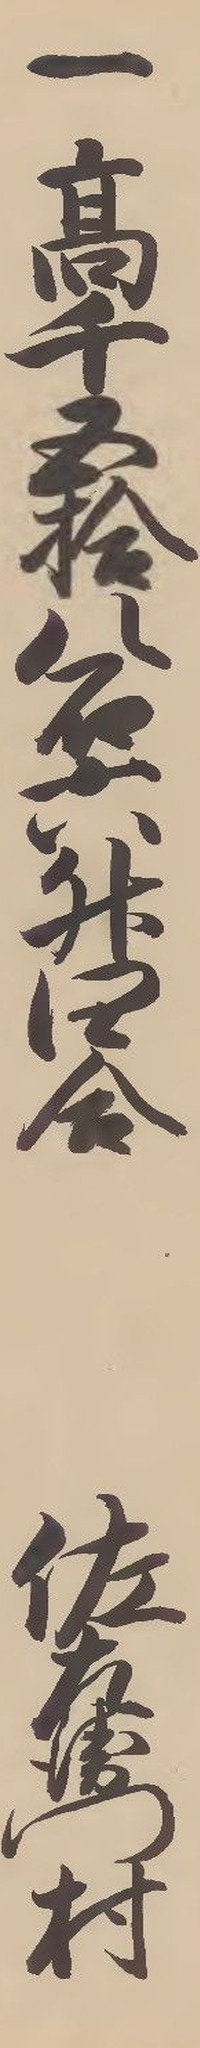一高千五拾八石六升四合佐左衛門村

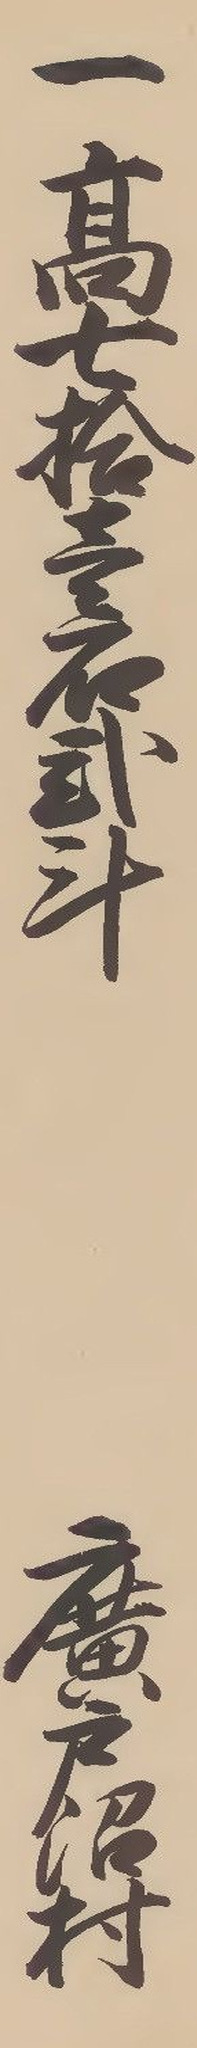一高七拾壱石弐斗広戸沼村
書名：武蔵国郷帳　下
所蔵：国立公文書館 National Archives of Japan
